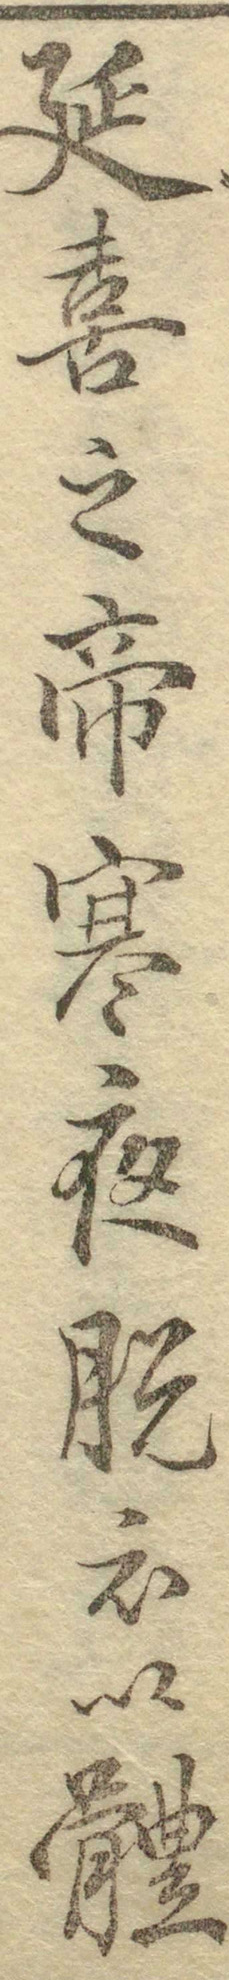延喜之帝寒夜脱衣以体
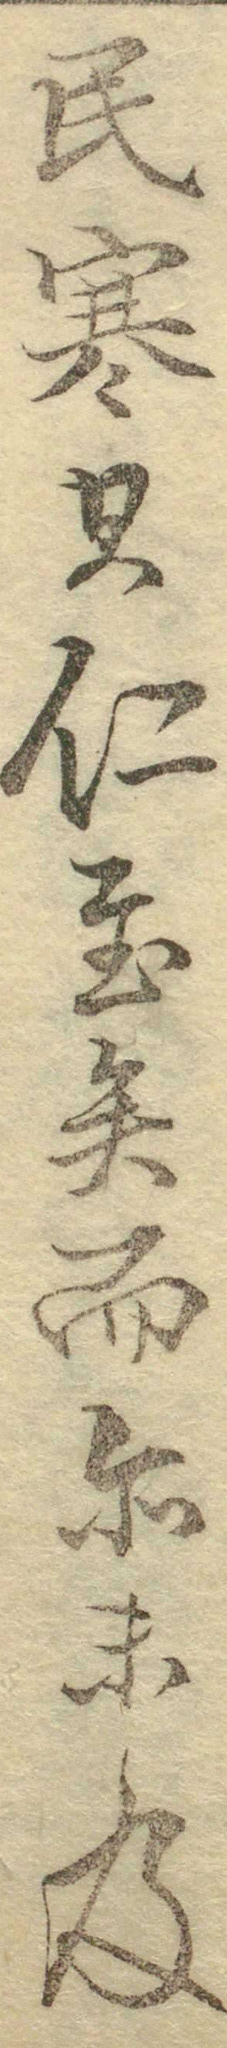民寒其仁至矣而亦未及
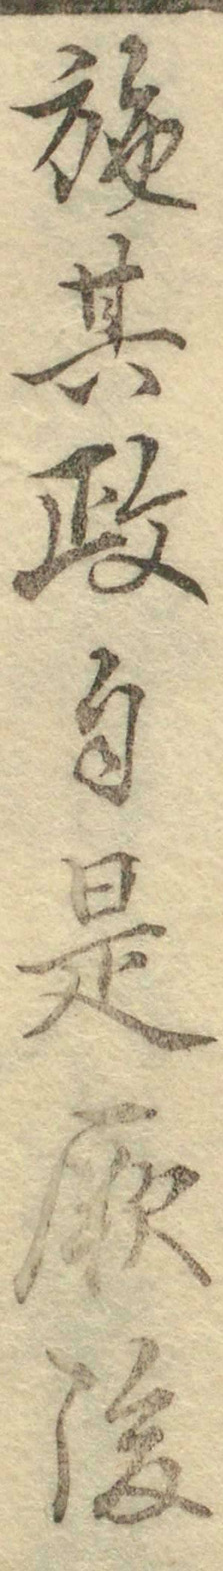施其政自是厥後
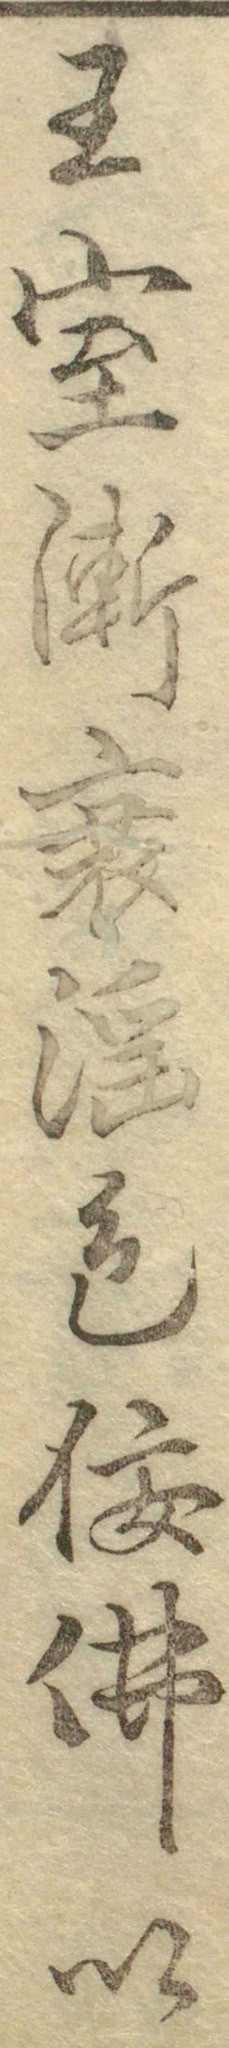王空漸衰淫色佞仏以
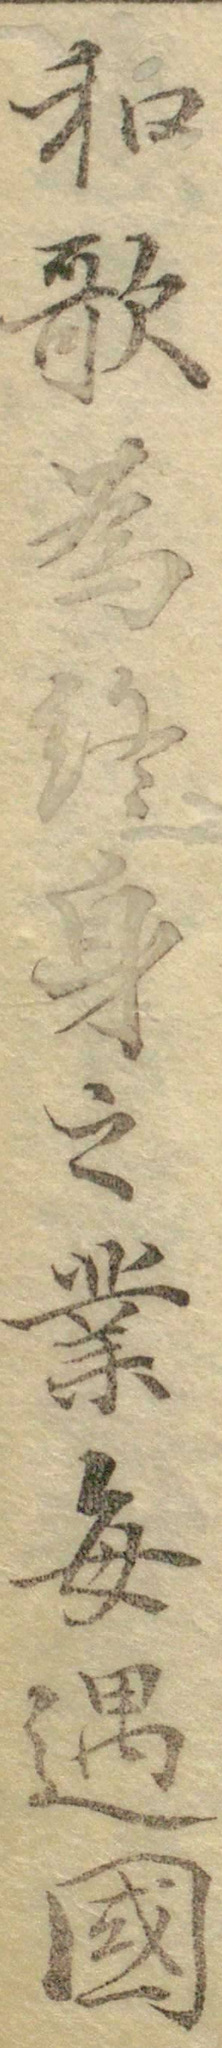和歌為終身之業毎遇国
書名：養蠶私録
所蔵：国文学研究資料館
